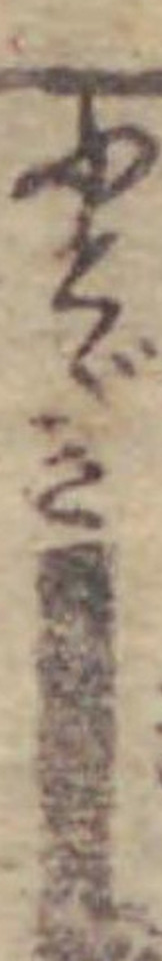ふとゞき
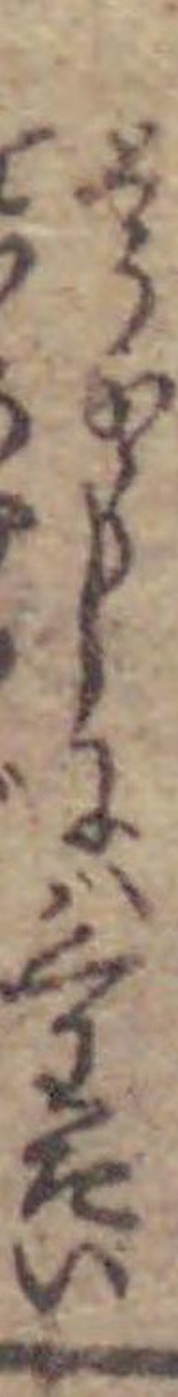とうかうしにはくわたい
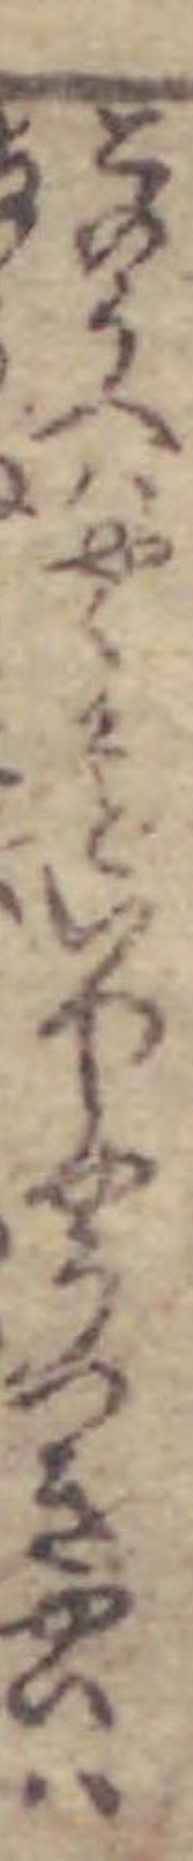このうへはやくみといつしやうつきやいは
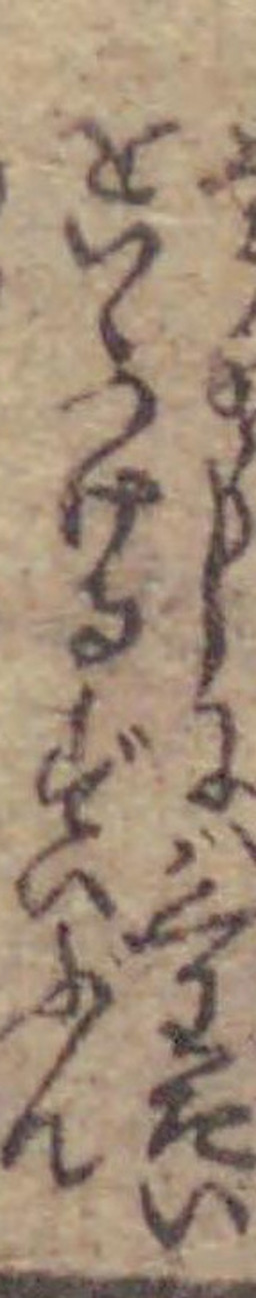をいゝつけるずいぶん
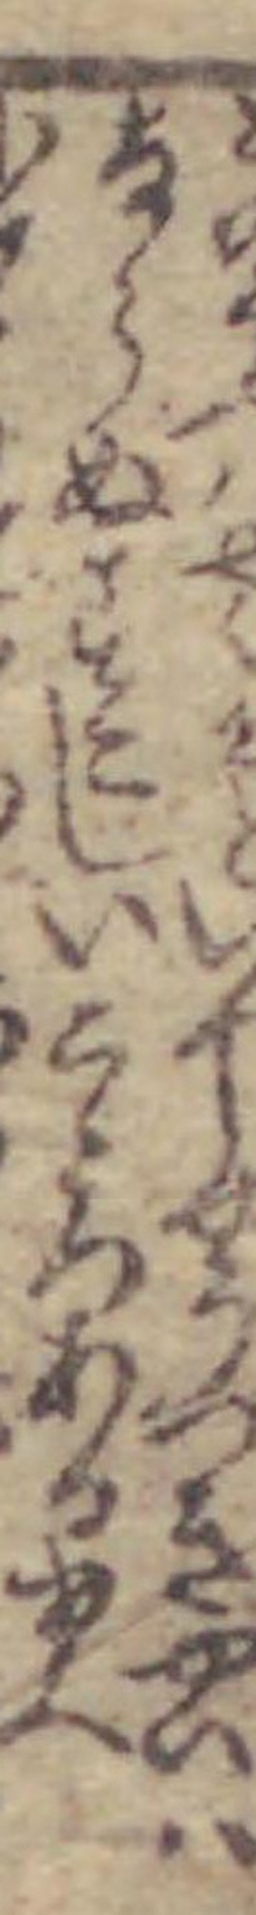ならぬすこしいこゝろあるゆへ
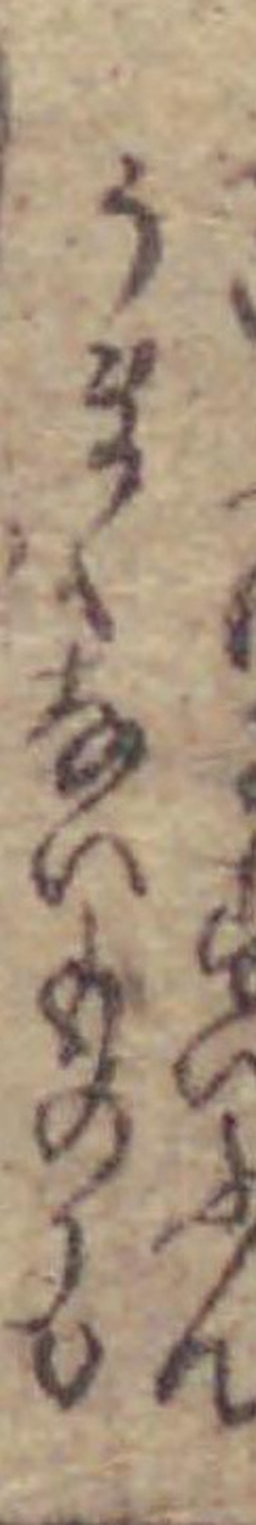うまくないものも
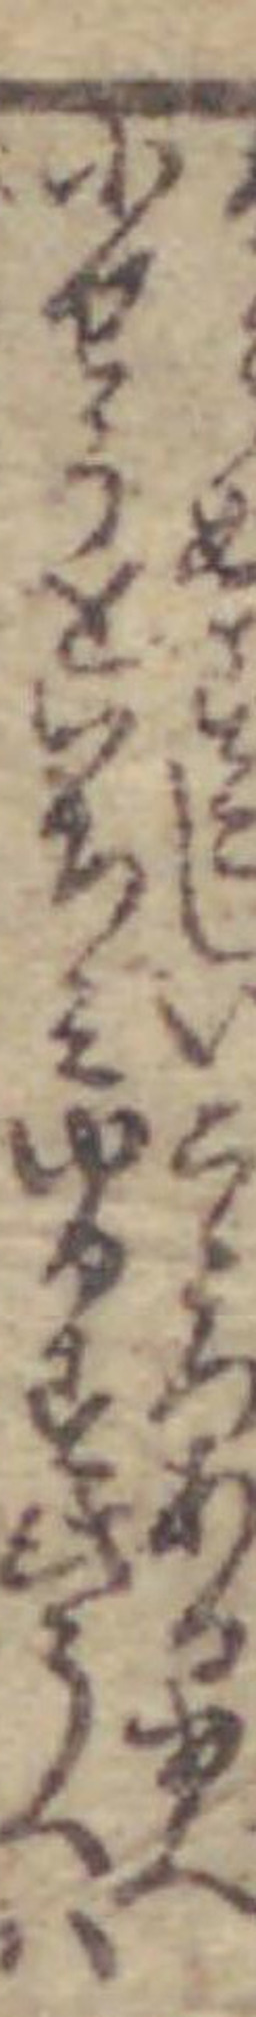こせうをいちみゆるす此うへは
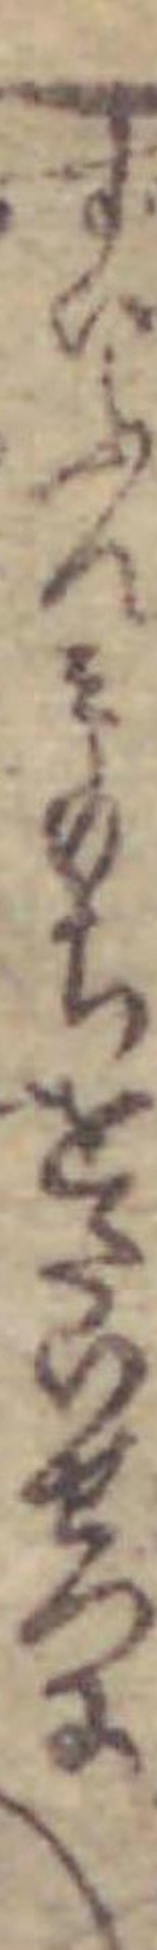ずいふんみもちをたいせつに
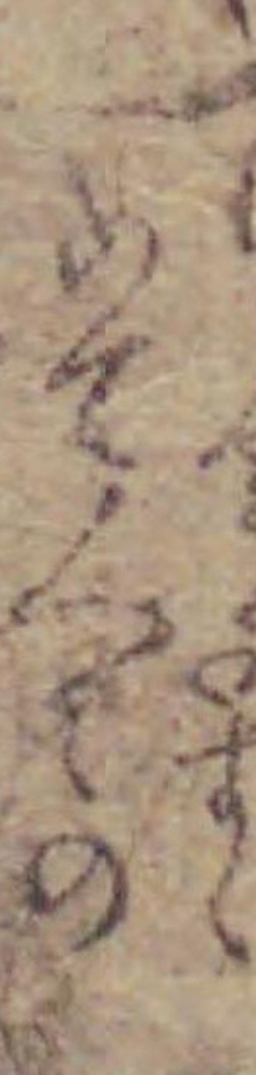めて人々の
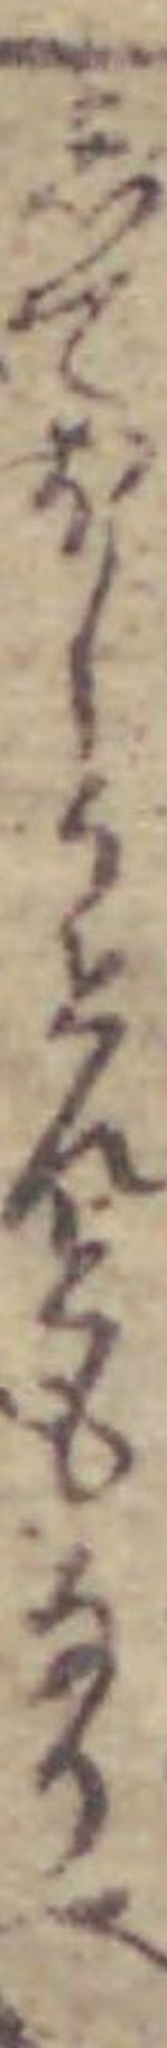してほしうとんともなり
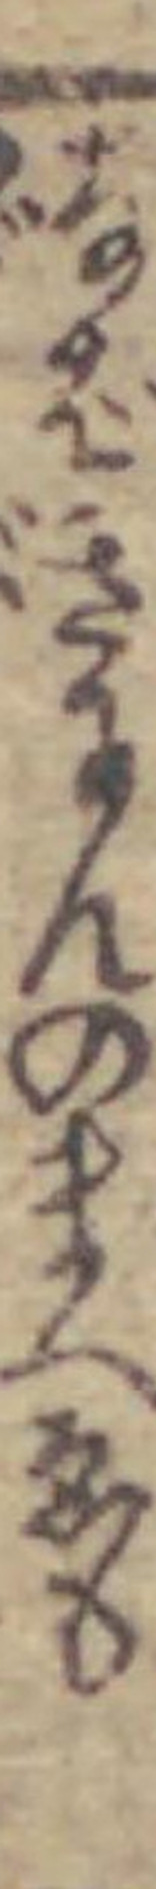なばきにんのまへゑも
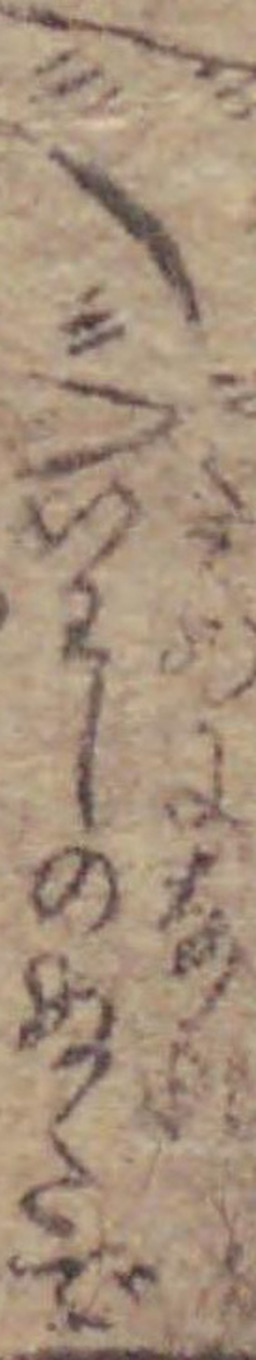いわしのぬたで
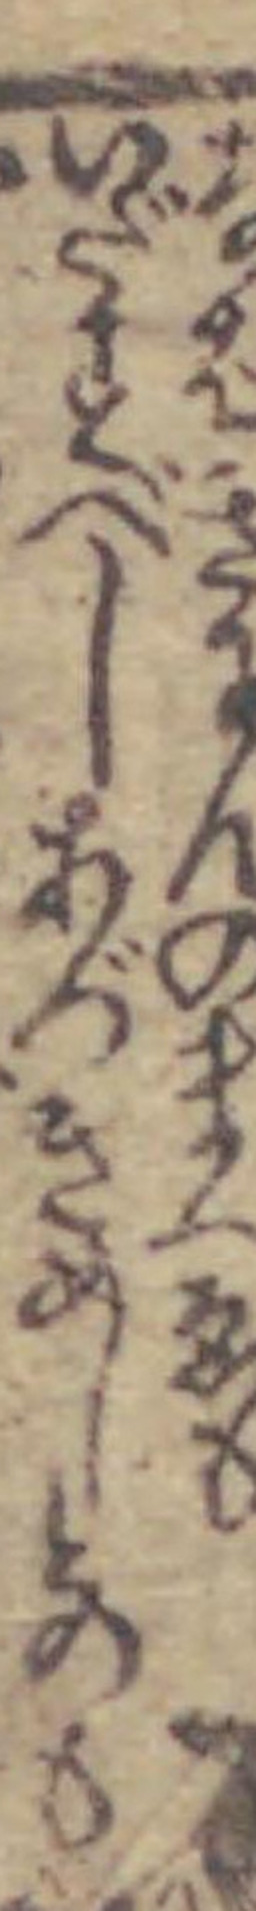いだすべしあづきめしとのも
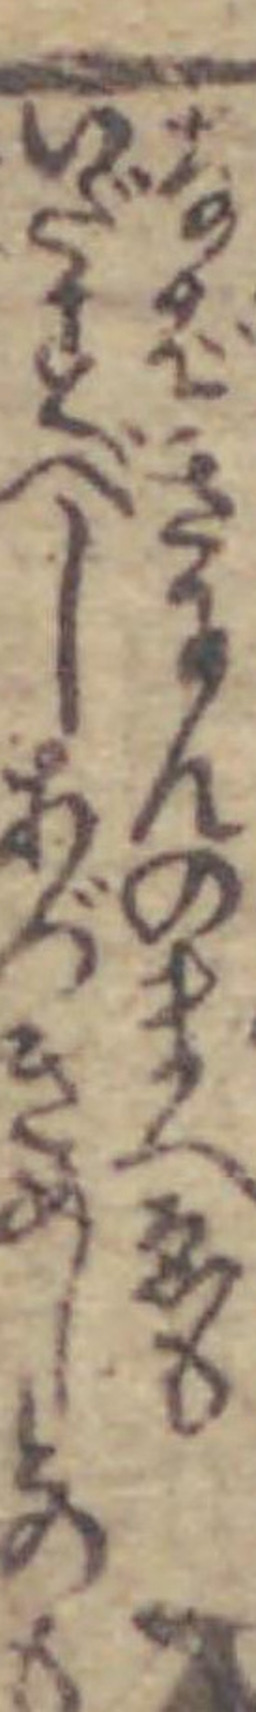いだすべしあづきめしとのも
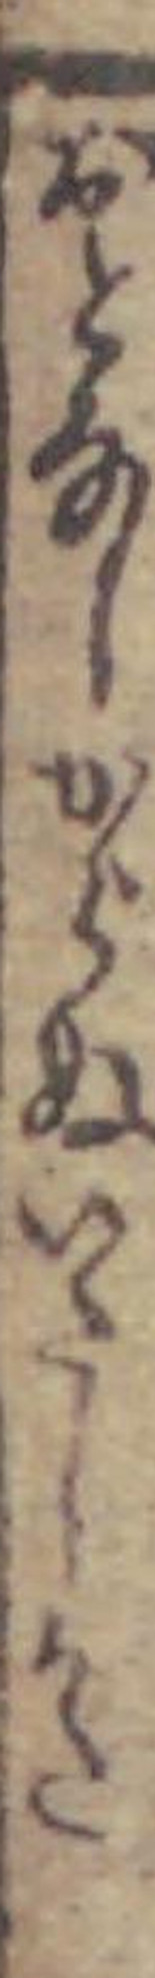おとなしからぬいたしかた
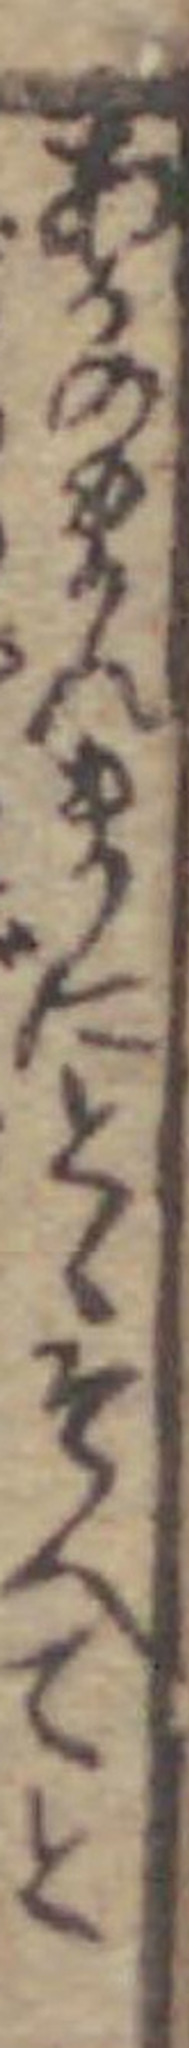あかのまんまにとゝそへてと
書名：諸事米の飯 : 3巻
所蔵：国立国会図書館 National Diet Library, JAPAN
